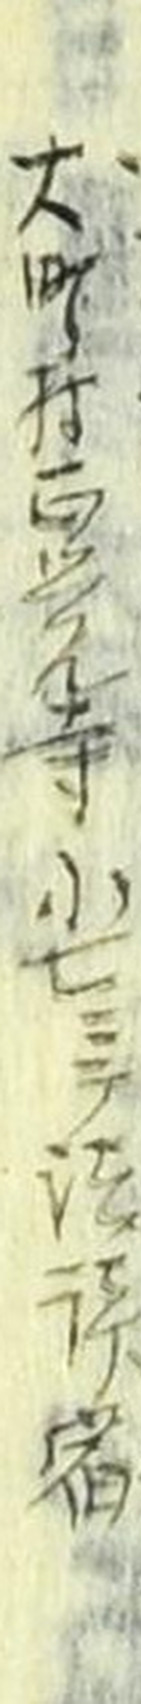大町村正覚寺小七ニテ法談宿
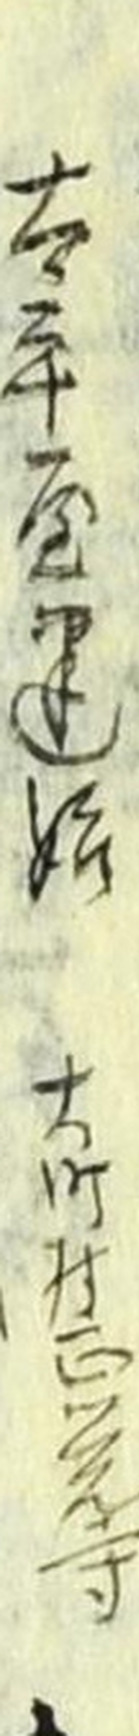太平屋建始大町村正覚寺
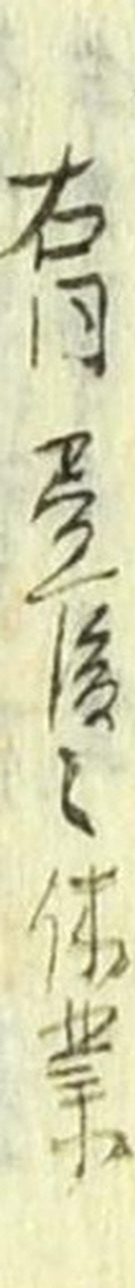右同昼後々休業
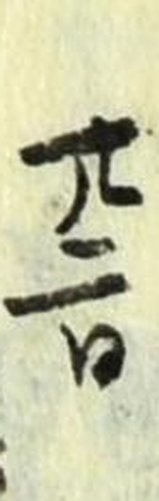廿二日
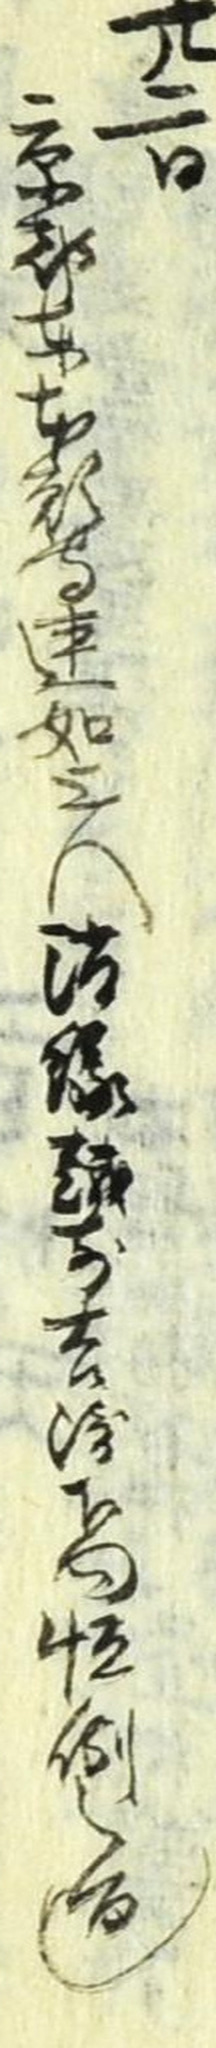京都東本願寺連如上人法縁越前吉崎下向恒例之通
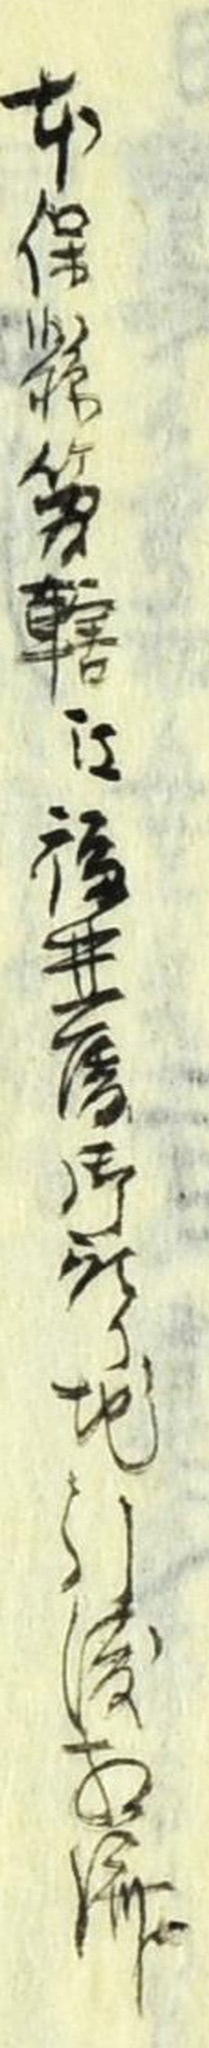本保県管轄江福井藩御預リ地引渡相済

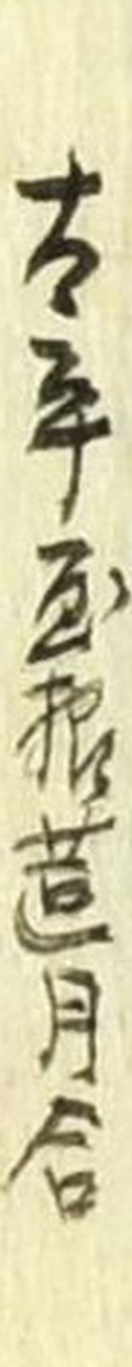太平屋根葺合
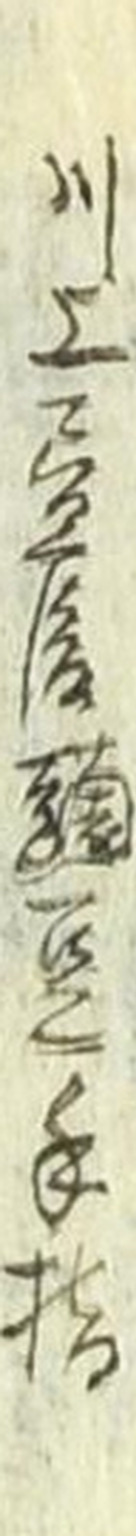川上昼後豌豆手指
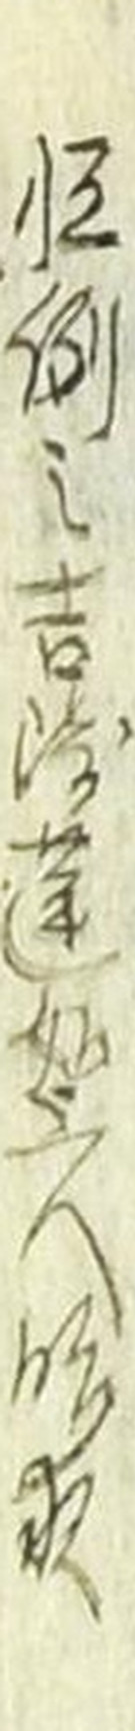恒例之吉崎蓮如上人昨夜
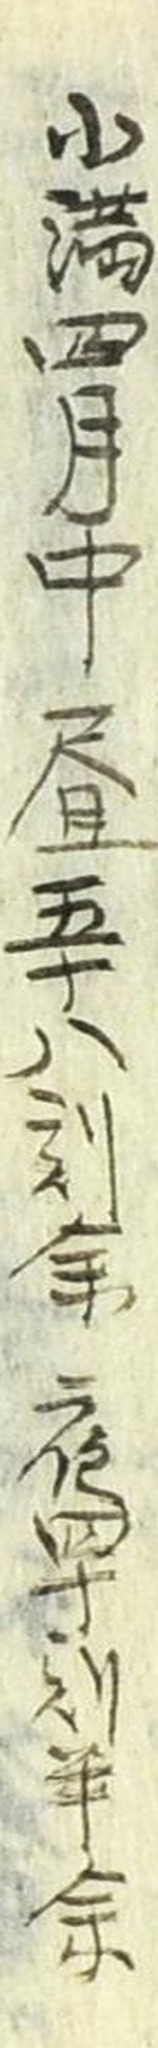小満四月中昼五十八刻余夜四十刻半余
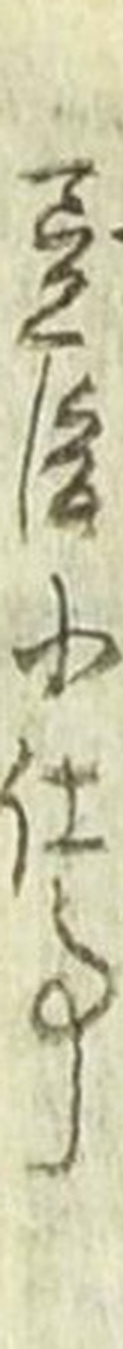昼後小仕事
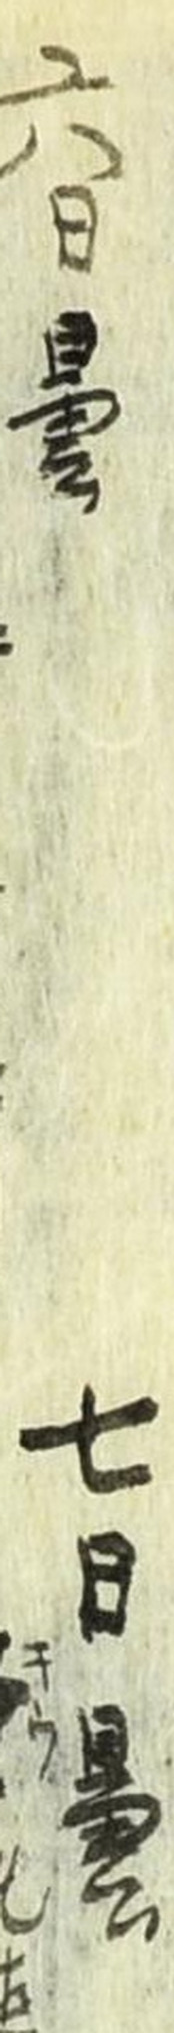六日曇七日曇
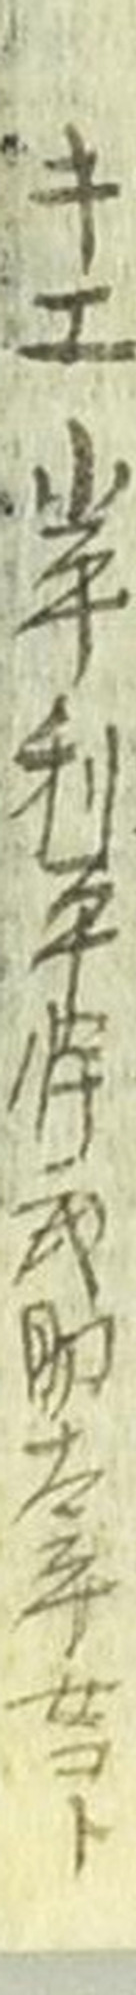キエ小平利平倅武助太平女コト
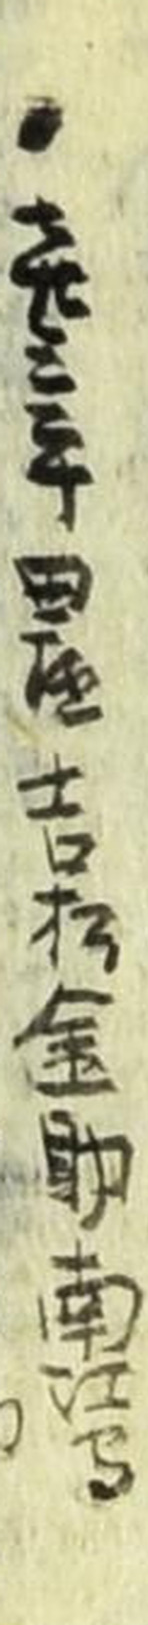●喜三平田植吉松金助南江守
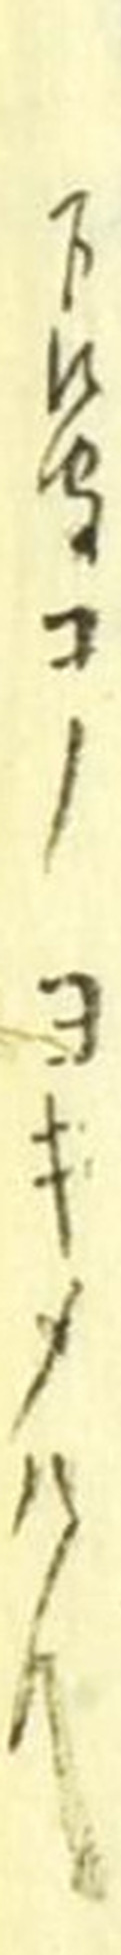下江守コノヨキ〆八人江

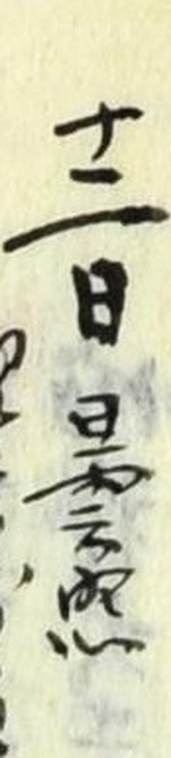十二日曇照
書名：（日記）
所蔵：福井県文書館 Fukui Prefectural Archives
